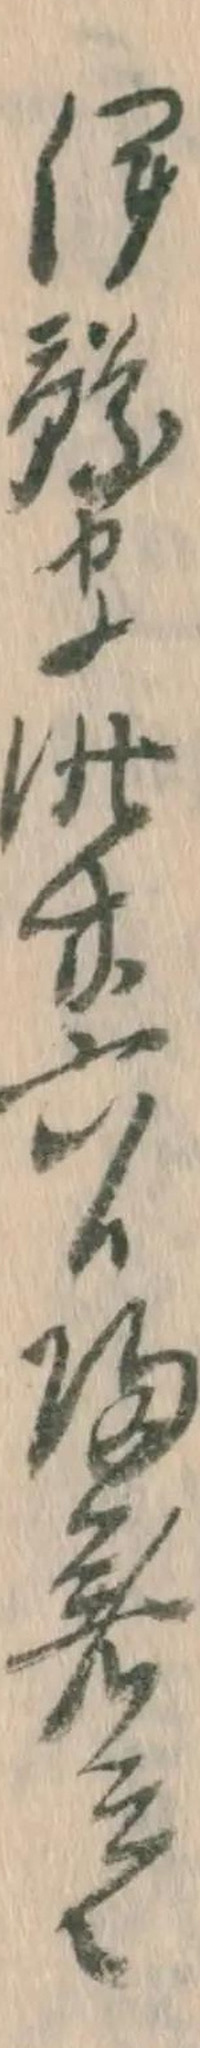伊豫守昨廿六日帰着云々
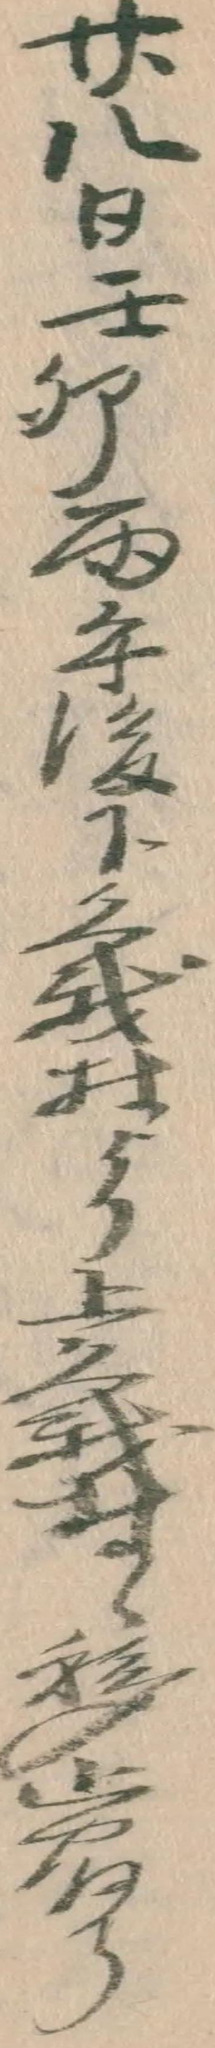廿八日壬卯雨午後下久我村より上久我村ヘ移止宿了
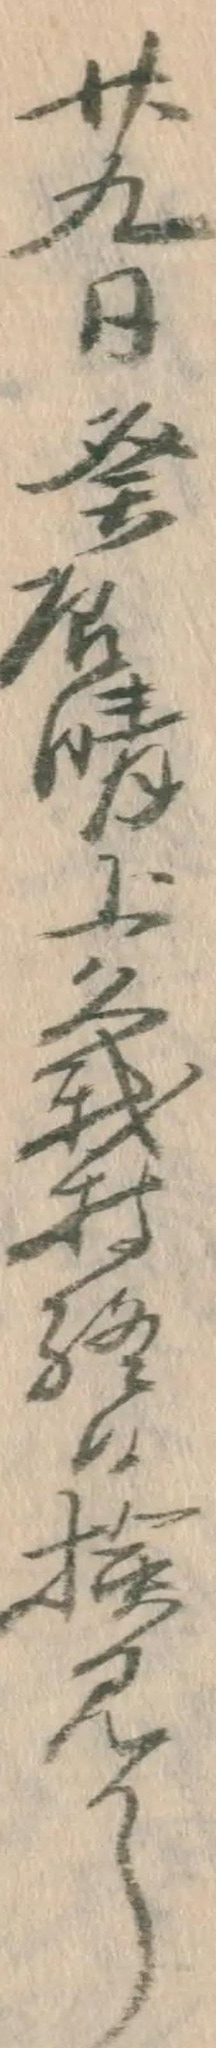廿九日癸辰晴上久我村終日検見了
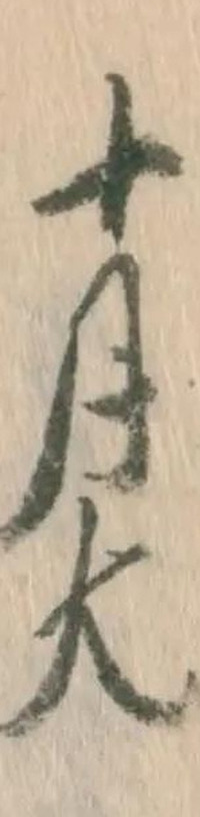十月大
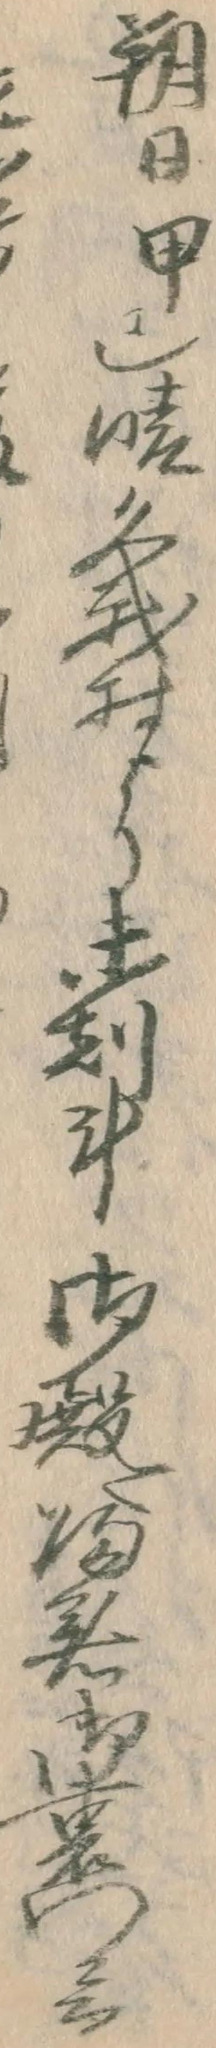朔日甲巳晴久我村より未刻斗御殿帰着御裏門二而
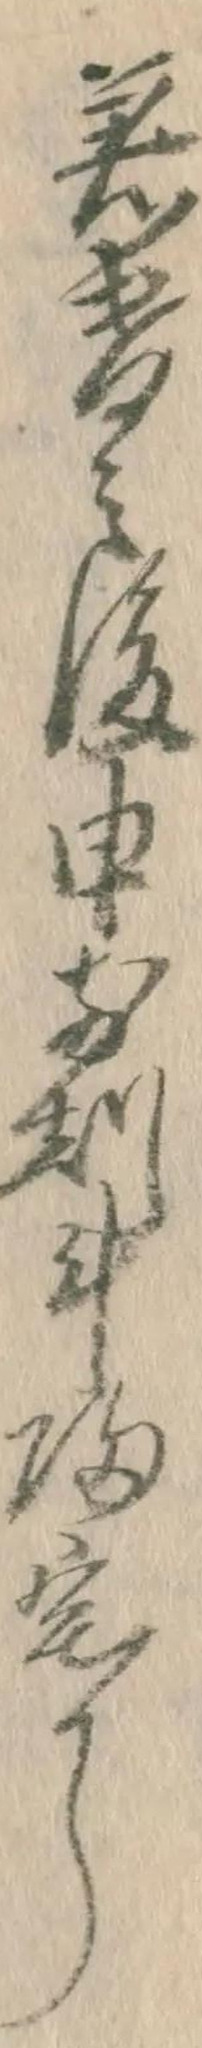着書之後申前刻斗帰宅了
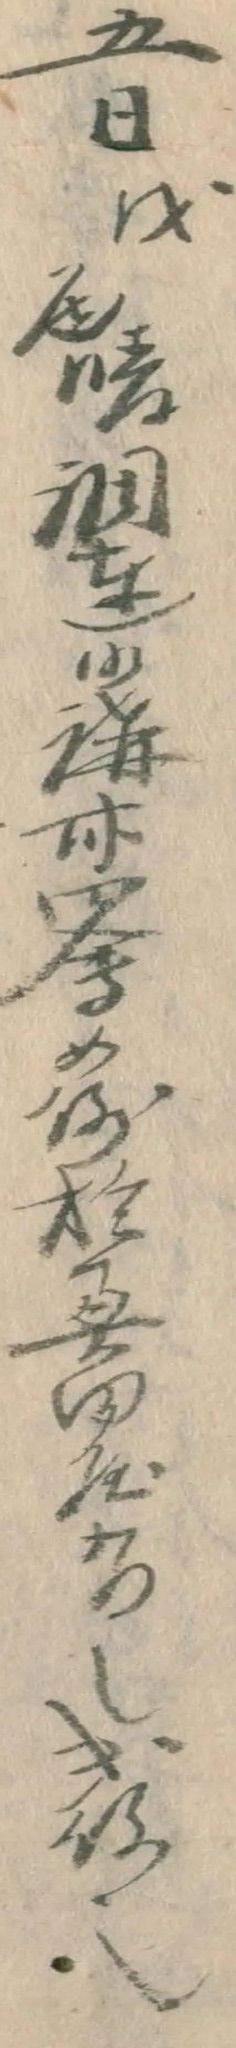五日戊酉晴調達御講卅四會如例於奥田屋有之出役也
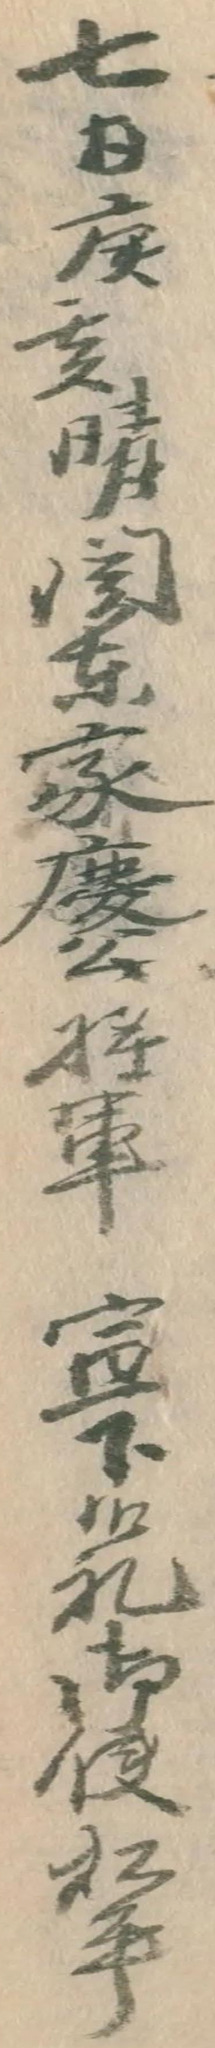七日庚亥晴関東家慶公将軍宣下御礼御使松平

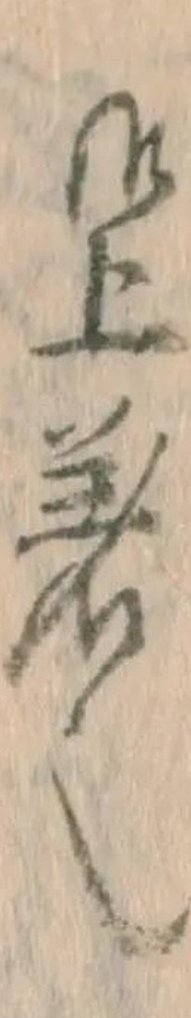御上着也
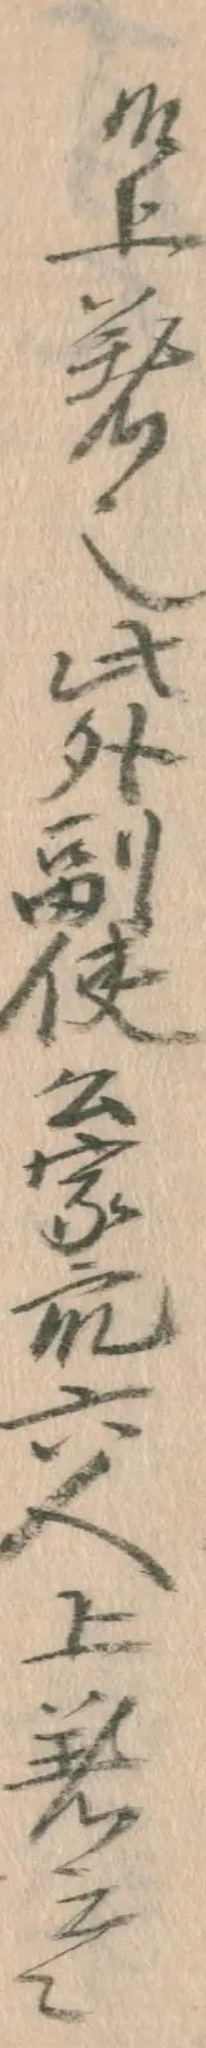御上着也此外副使公家衆六人上着云々
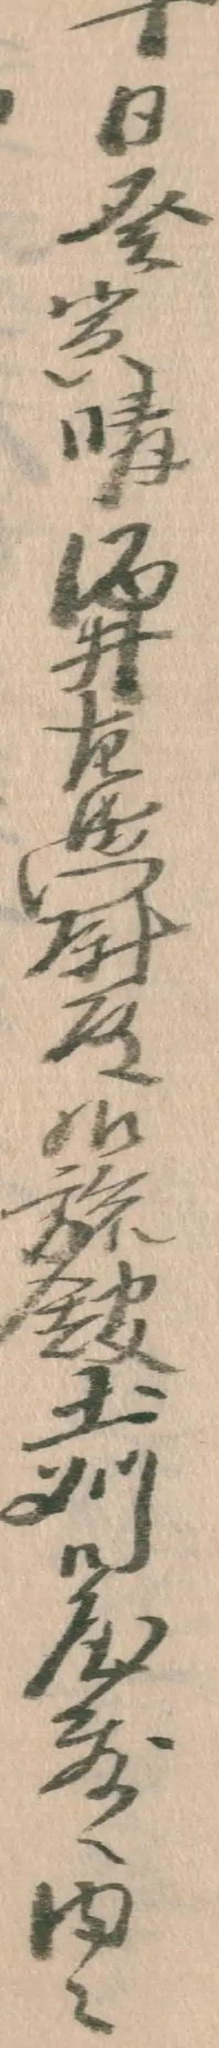十日癸寅晴酒井左衛門尉殿御旅館土州御屋敷へ内々
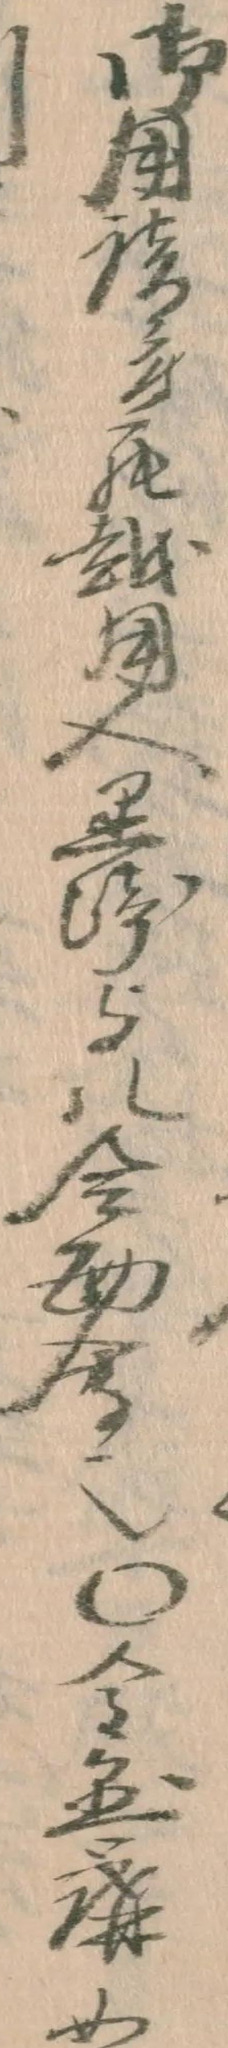御用請ニ付罷越用人黒崎与八令面會也○金懸御講如
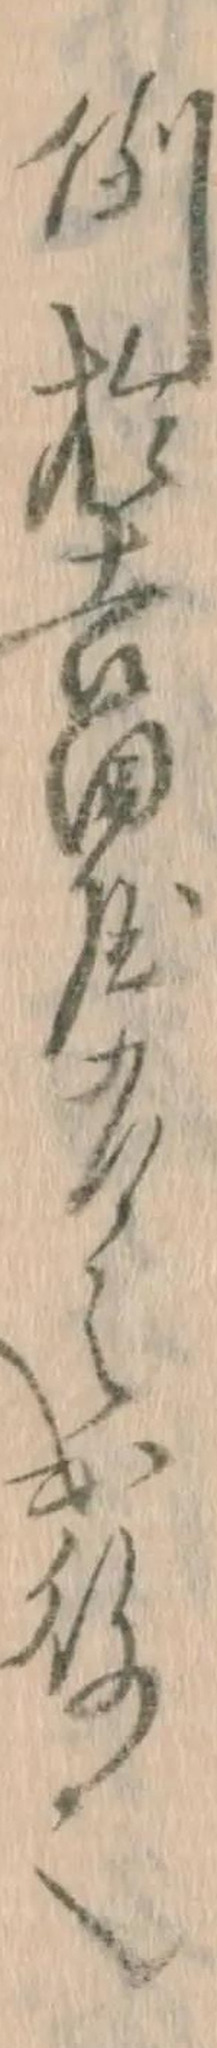例於吉田屋有之出役也
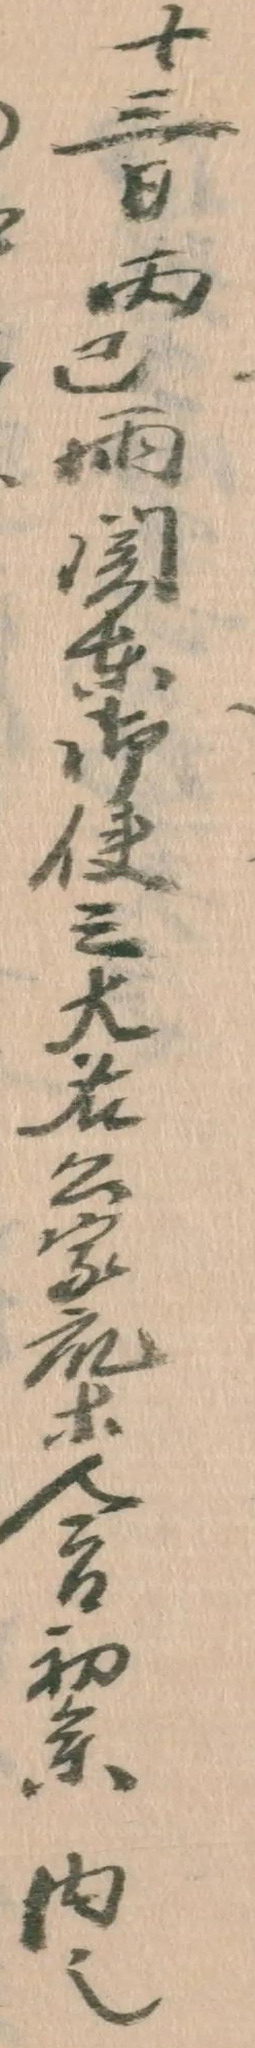十三日丙巳雨関東御使三大名公家衆等今日初参内也
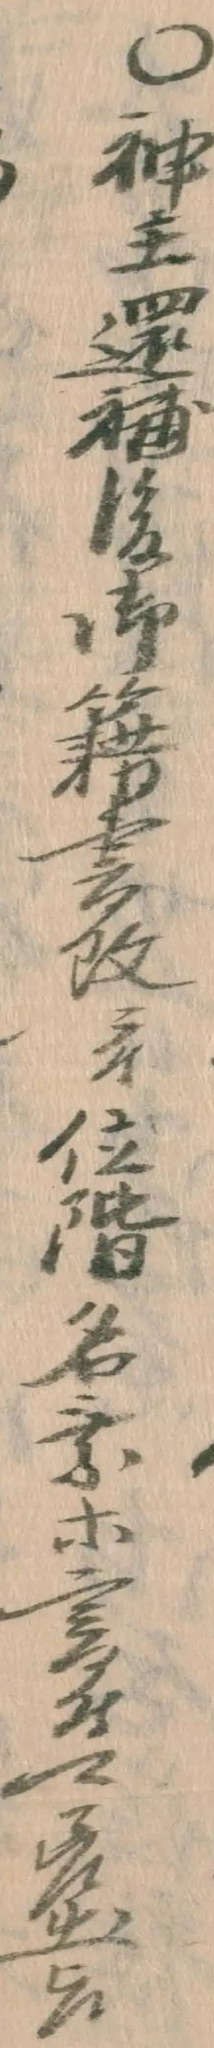○神主還補後御籍書改ニ付位階名乗等書付可差出旨
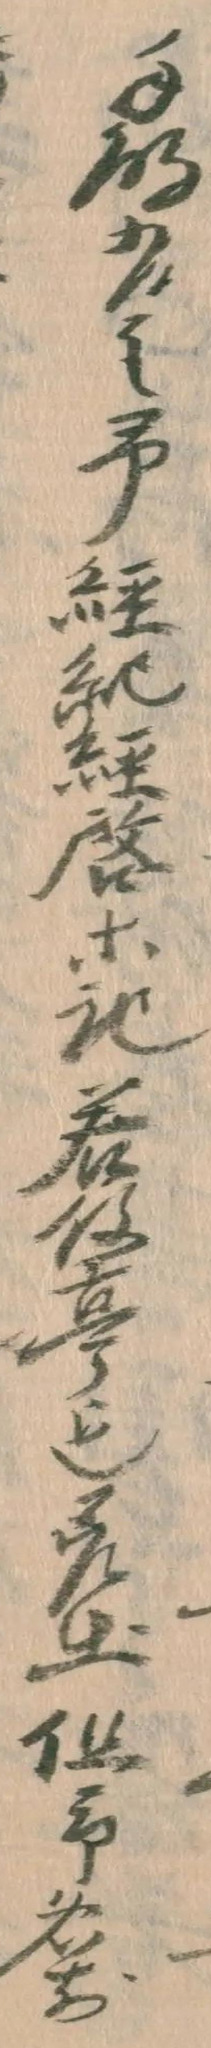手觸有之予経紀経啓等記若役亭迄差出但予名前
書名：賀茂社記録. 第67冊
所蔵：国立国会図書館 National Diet Library, JAPAN
